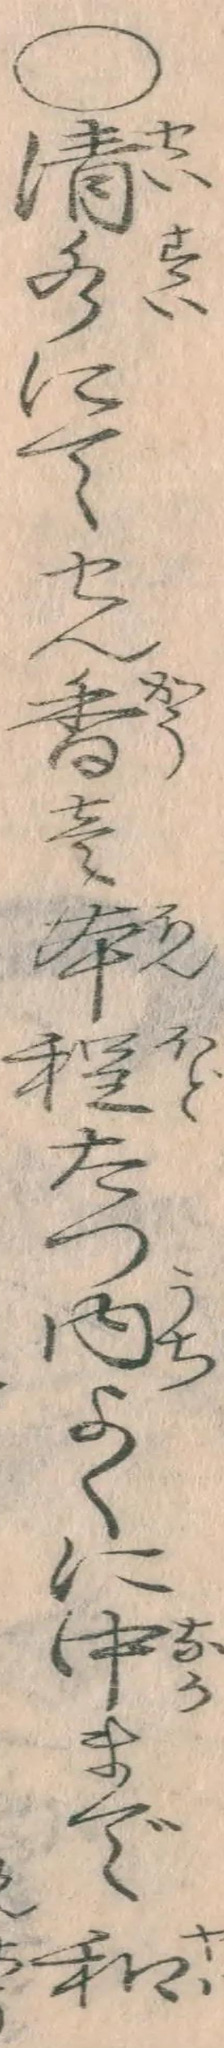○清水にてせん香壱本程たつ内に中まで和
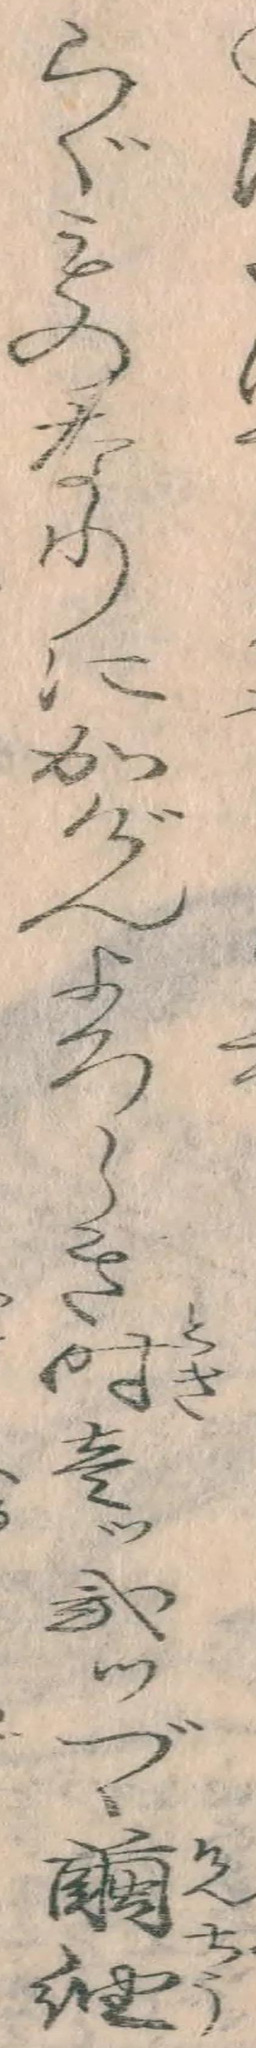らぐものなりにかげんよろしき時壱ツ弐ツづゝ繭紬
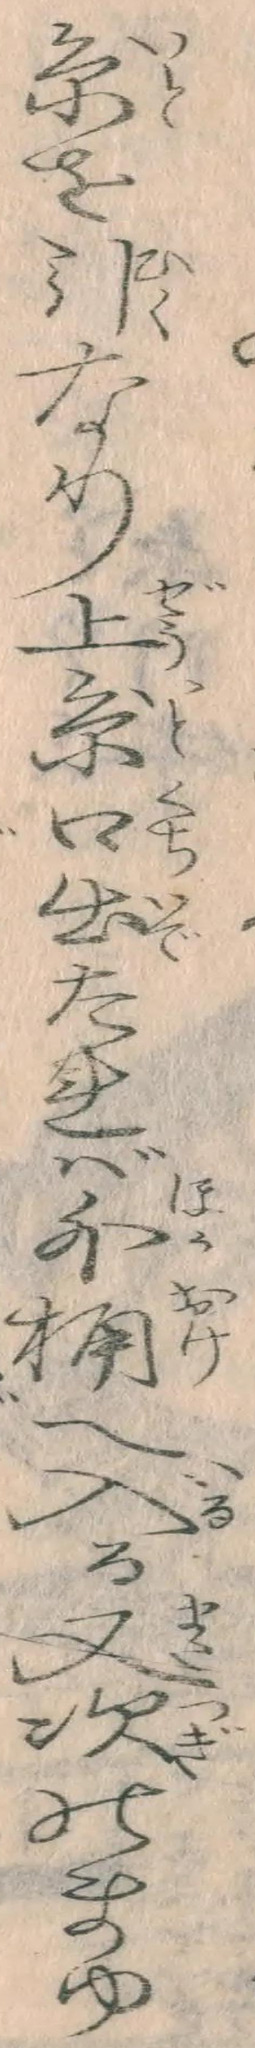糸を引なり上糸口出たれば外桶へ入る又次のまゆ
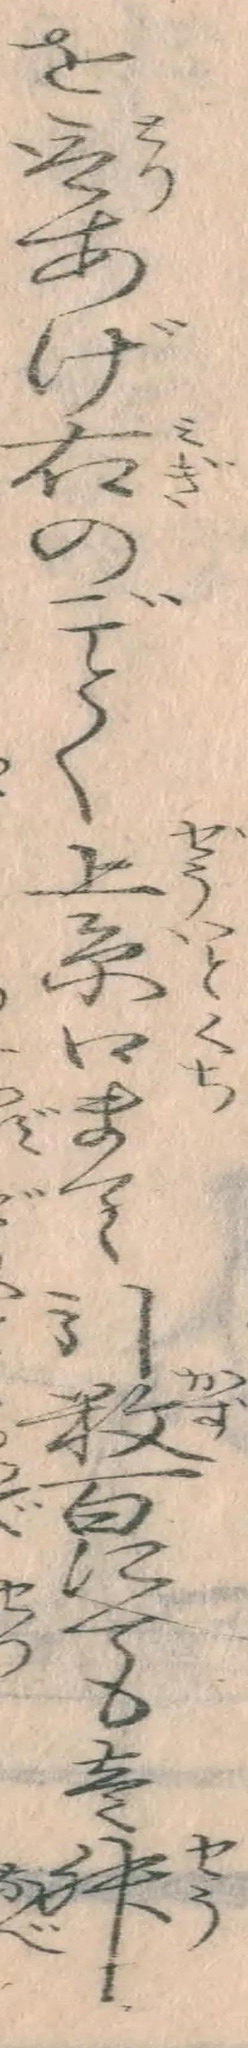を取右のごとく上糸口まて引数百にても壱升
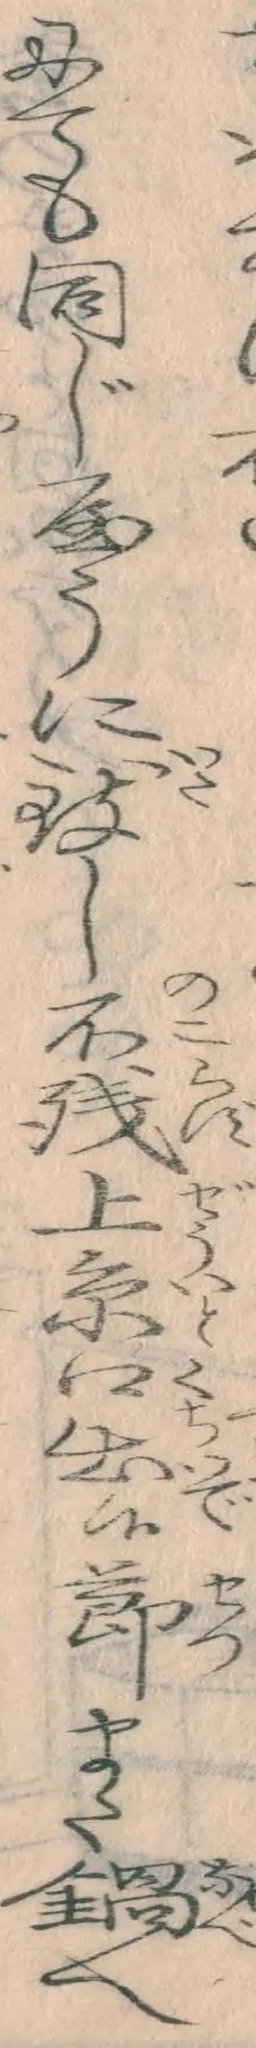にても同じやうに致し不残上糸口出候節また鍋へ
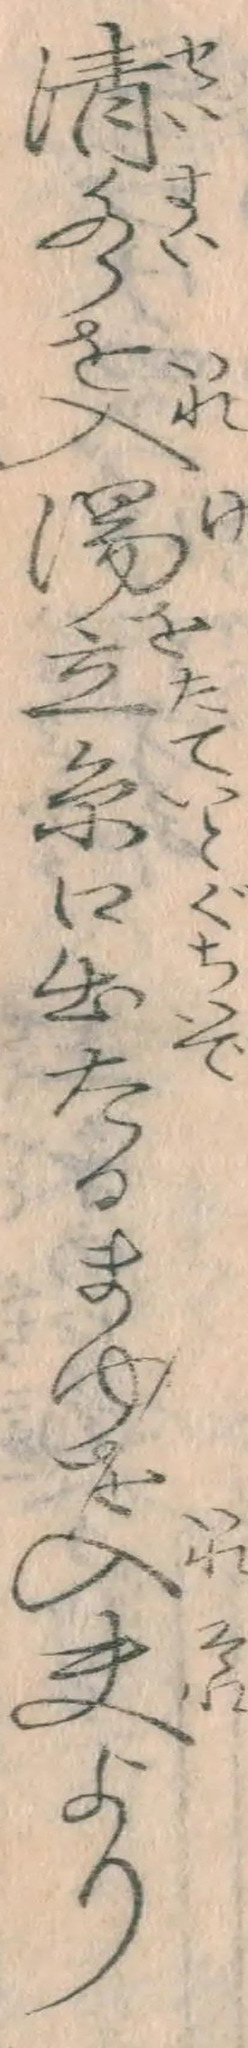清水を入湯を立糸口出たるまゆを入夫より

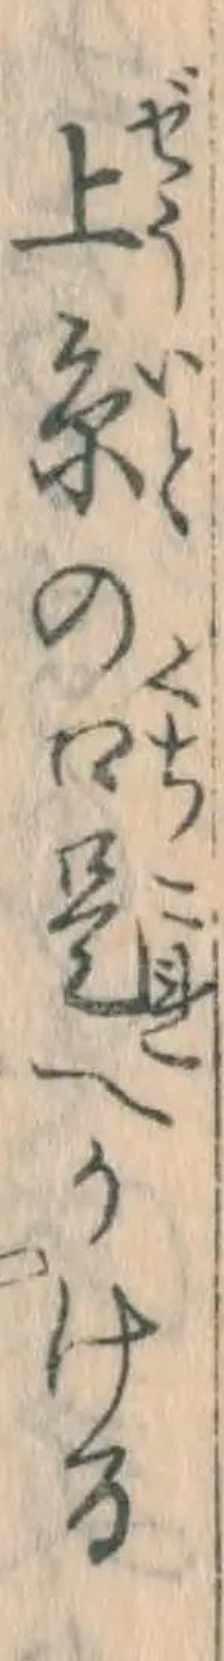上糸の口是へかける
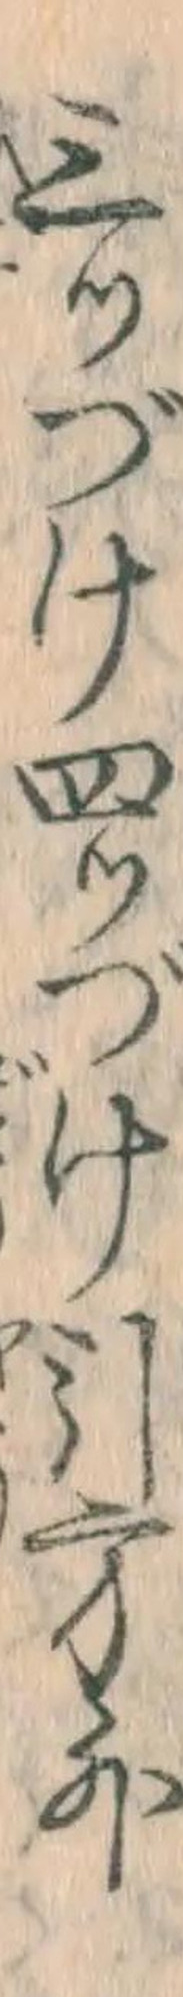三ツづけ四ツづけ引方外
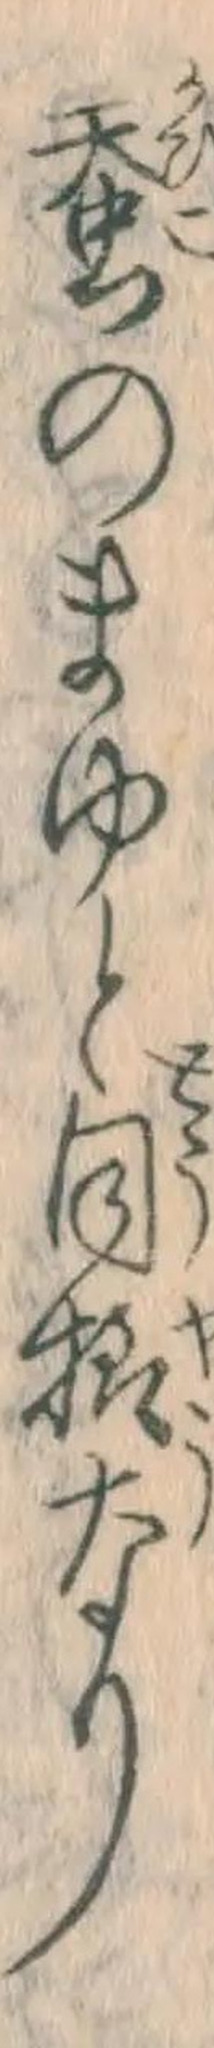蚕のまゆと同様なり
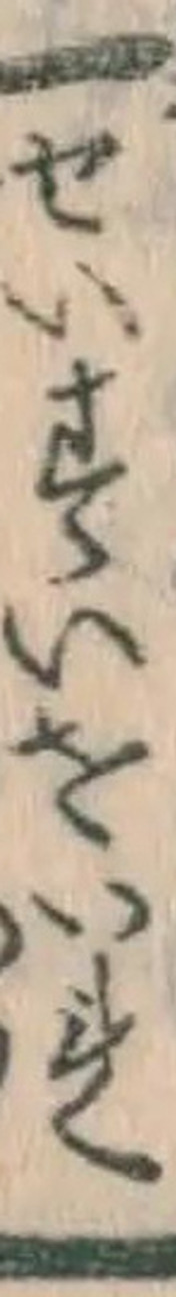せいすいをいれ
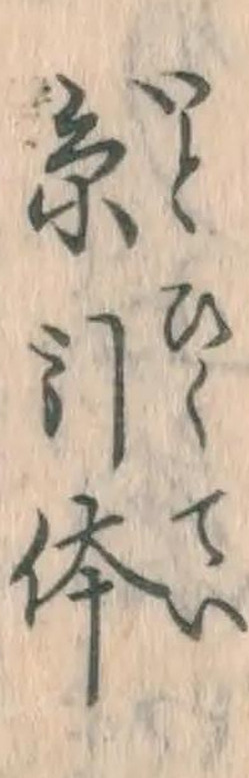糸引体
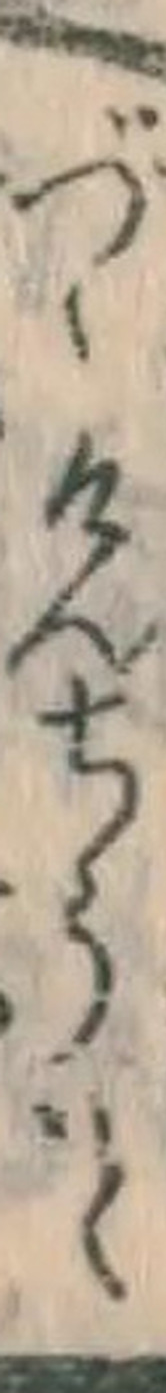づゝけんちういと
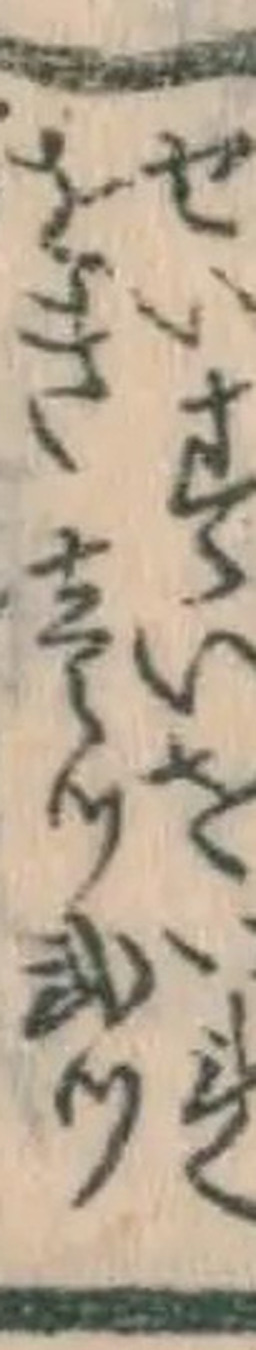をき壱ツ弐ツ
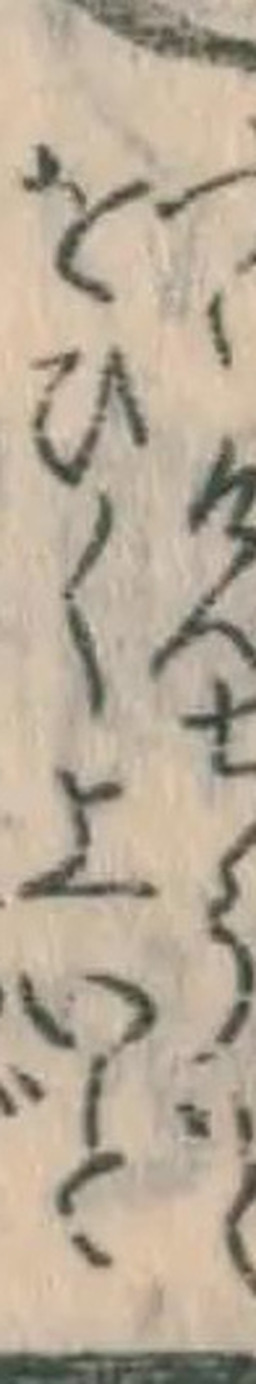をひく上いと
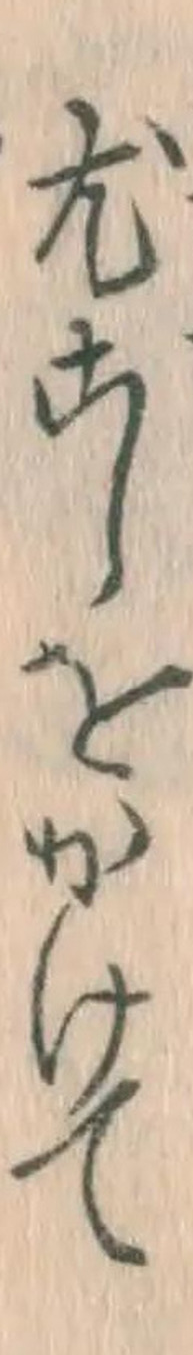尤こしをかけて
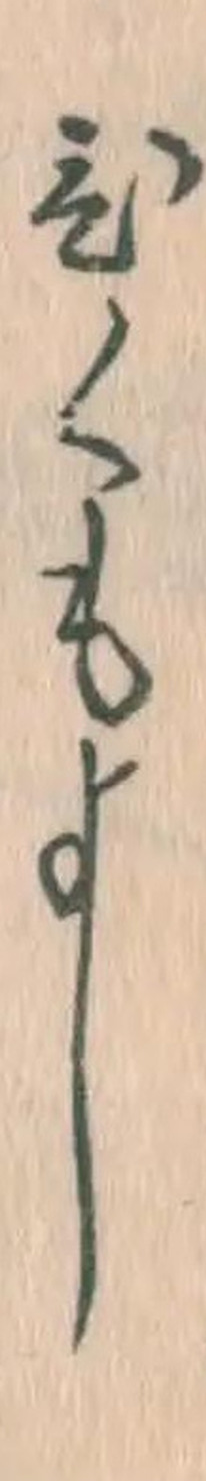ひくもよし
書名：山繭養法秘傳抄
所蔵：国立国会図書館 National Diet Library, JAPAN
